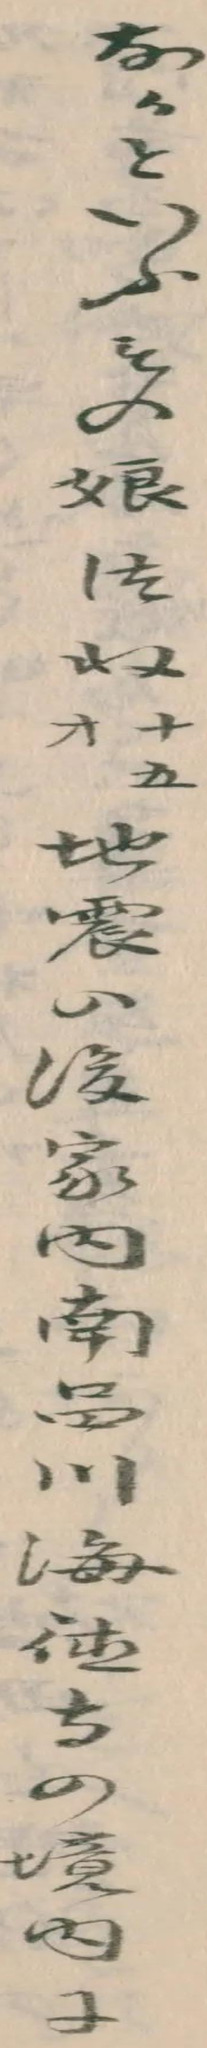なかといふもの娘つね十五才地震の後家内南品川海徳寺の境内に
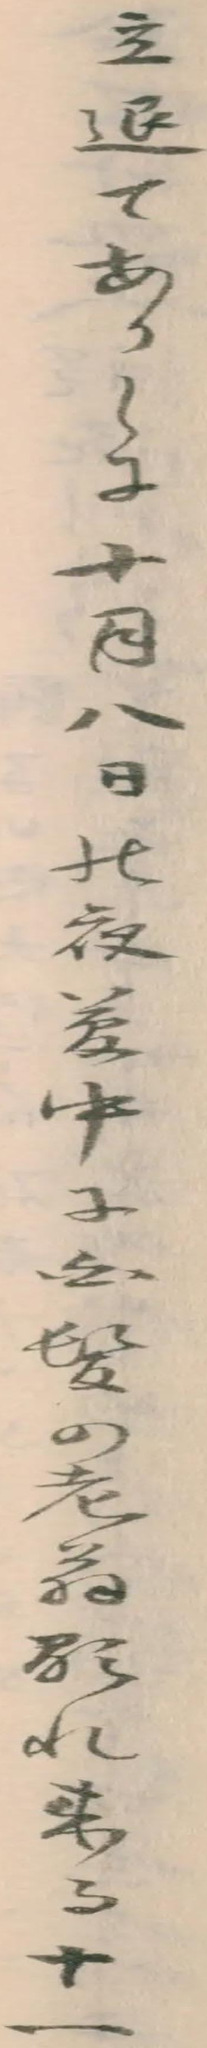立退てありしに十月八日の夜夢中に白髪の老翁顕れ来る十一
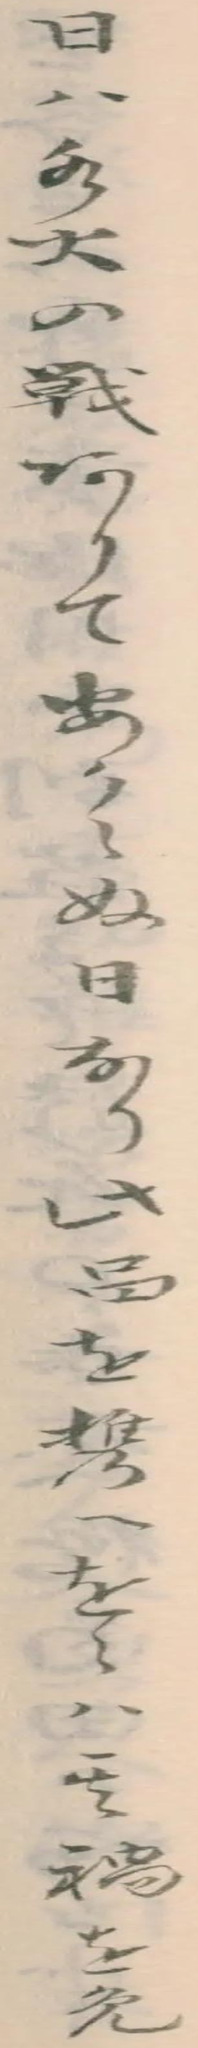日は水火の戦ありて安からぬ日なり此品を携へをらは其禍を免
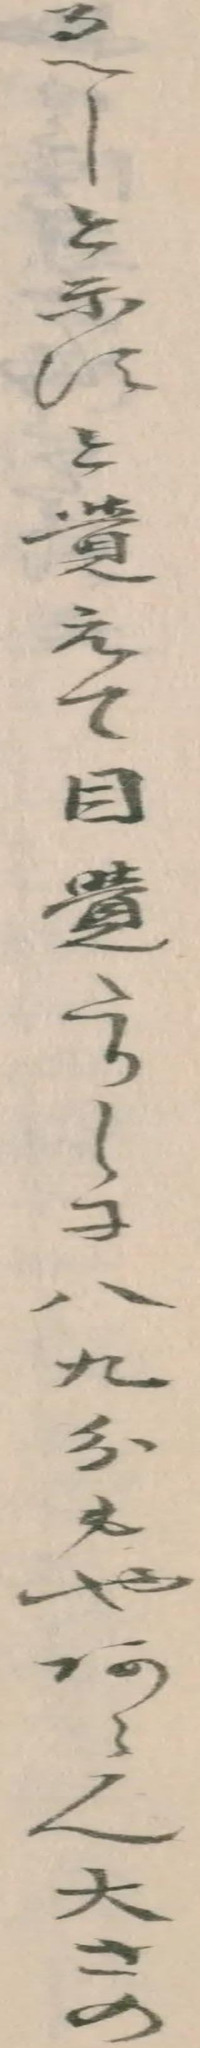るへしと示すと覚えて目覚たりしに八九分もやあらん大さの
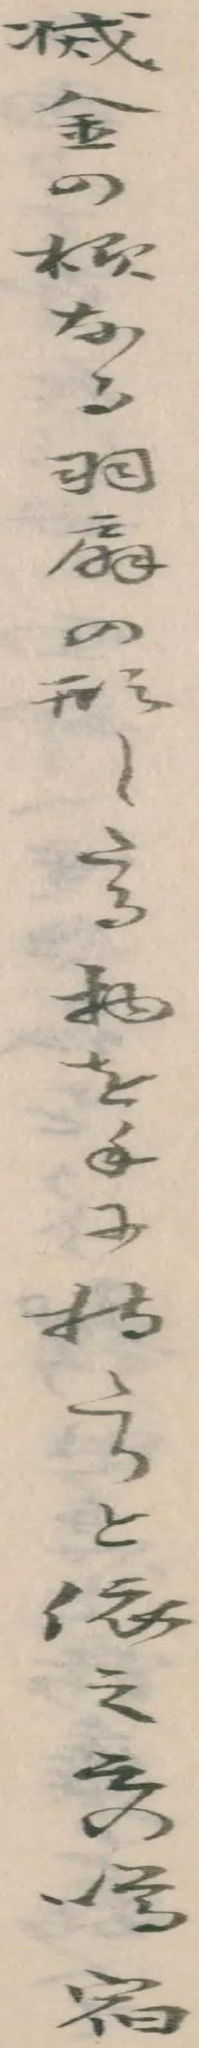滅金の様なる羽扇の形したる物を手に持たりと依之云の噂宿
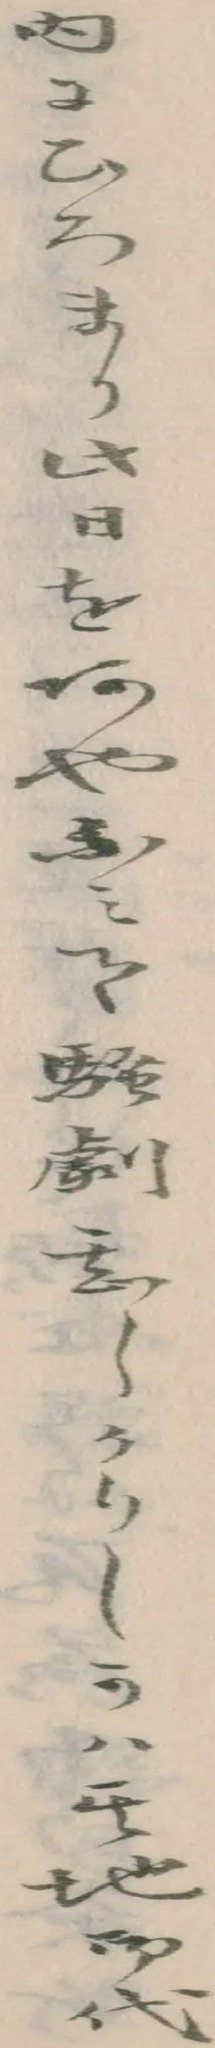内にひろまり此日をあやふみて騒劇甚しかりしかは其地御代
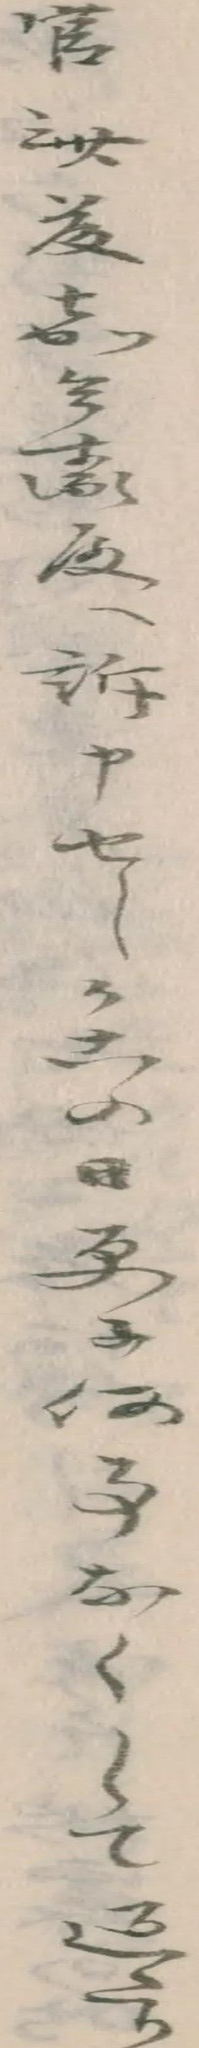官無藤嘉兵衛殿へ訴申せしかこの日更に何事なくして返たり
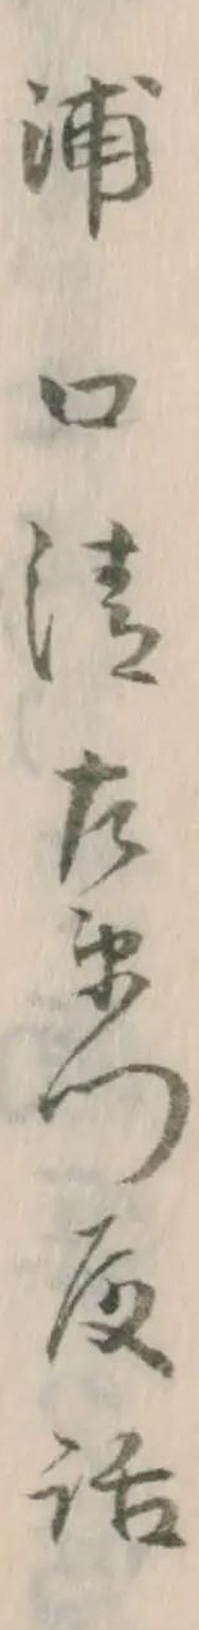浦口清左衛門殿話

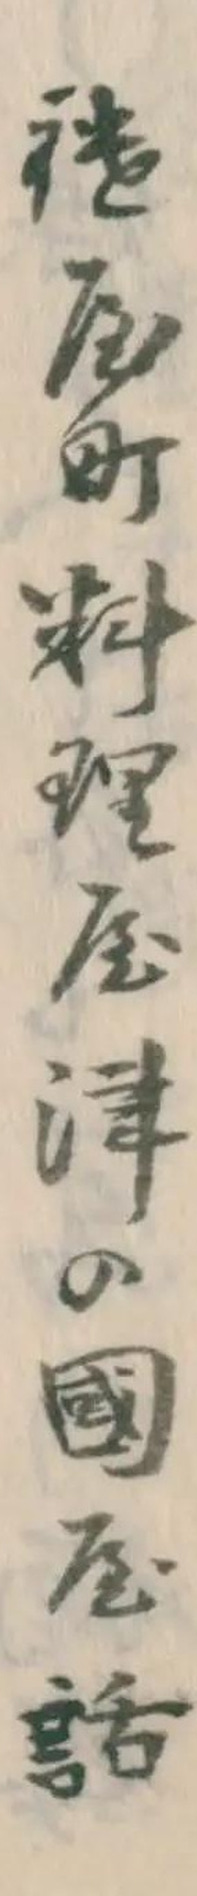鑓屋町料理屋津の国屋話
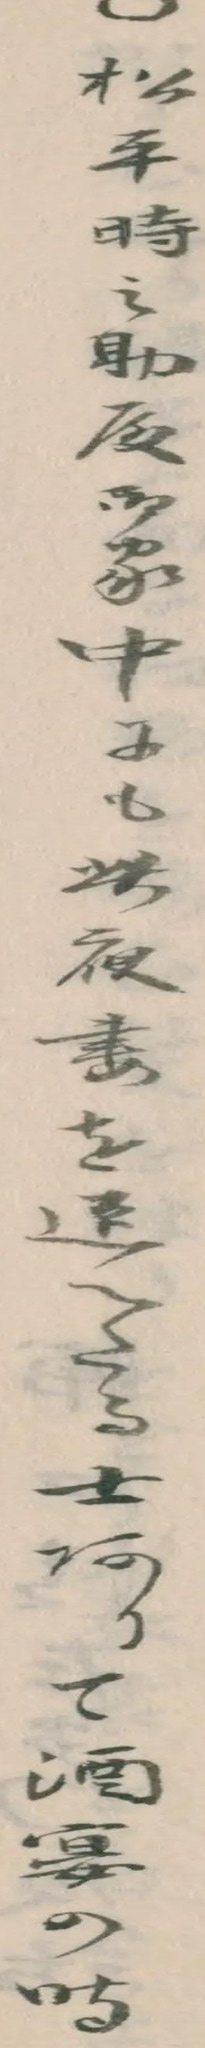〇松平時之助殿御家中にも此夜妻を迎へたる士ありて酒宴の時
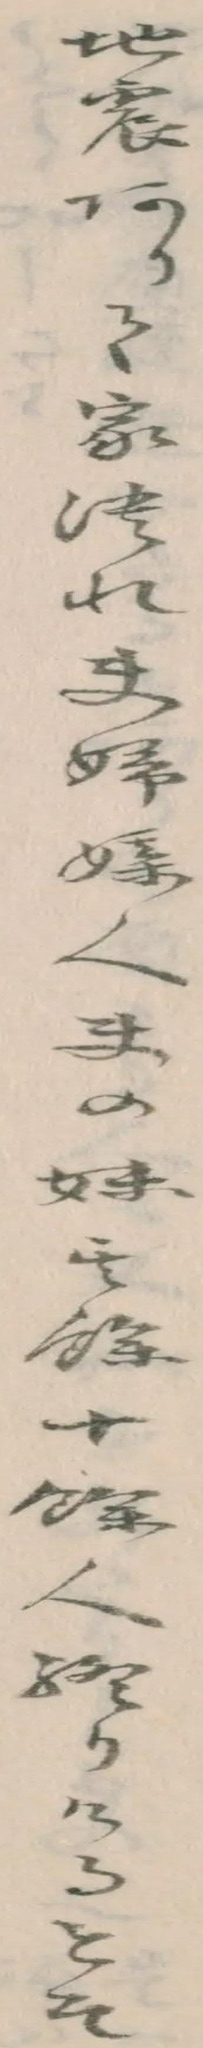地震ありて家潰れ夫婦媒人夫の妹其余十余人終りけるとそ
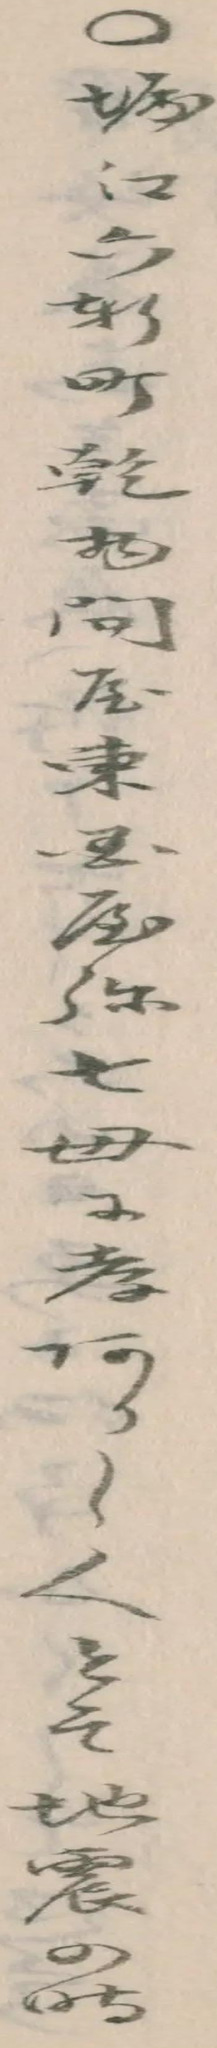〇堀江六軒町乾物問屋東国屋弥七母に孝ありし人とそ地震の時
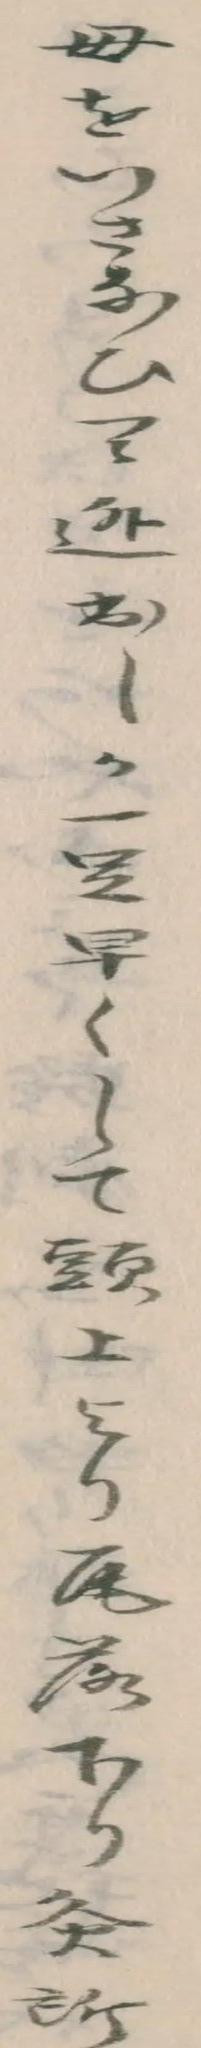母をいさなひて逃出しか一足早くして頭上より瓦落下り灸所
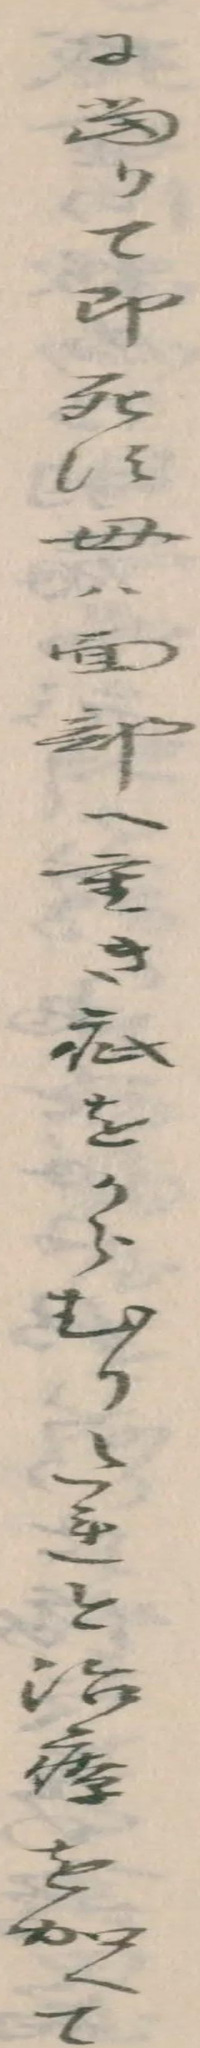に当りて即死す母は面部へ重き疵をからむりたれと治療を加へて
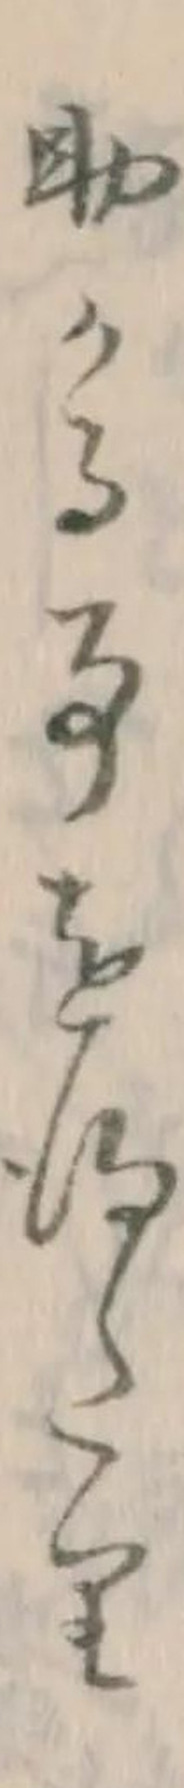助かる事を得たり
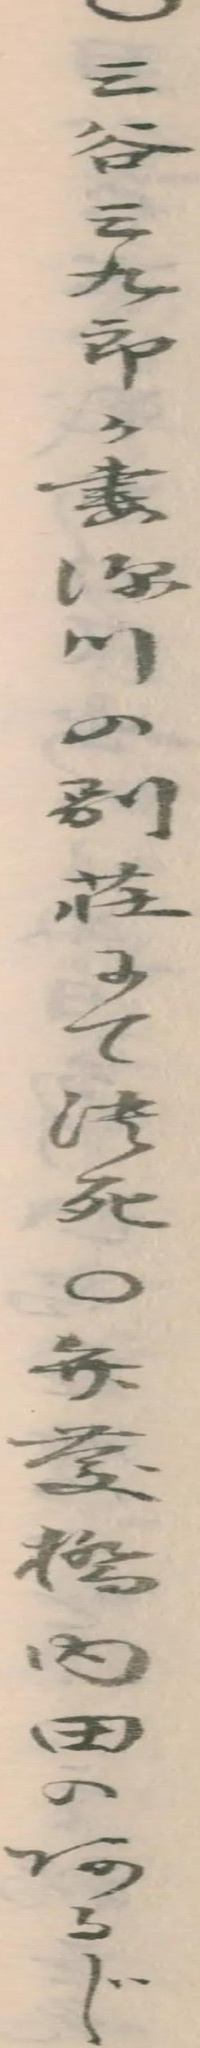〇三谷三九郎か妻深川の別荘にて潰死〇弁慶橋内田のあるじ
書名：地災撮要. 巻7-9(地震之部)
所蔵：国立国会図書館 National Diet Library, JAPAN
